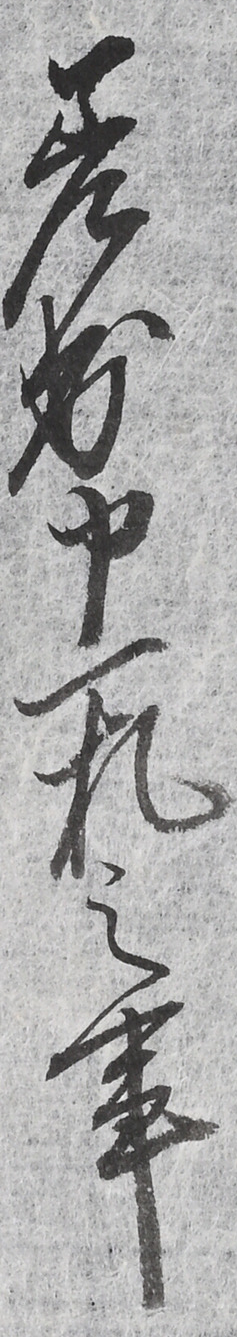差上申一札之事
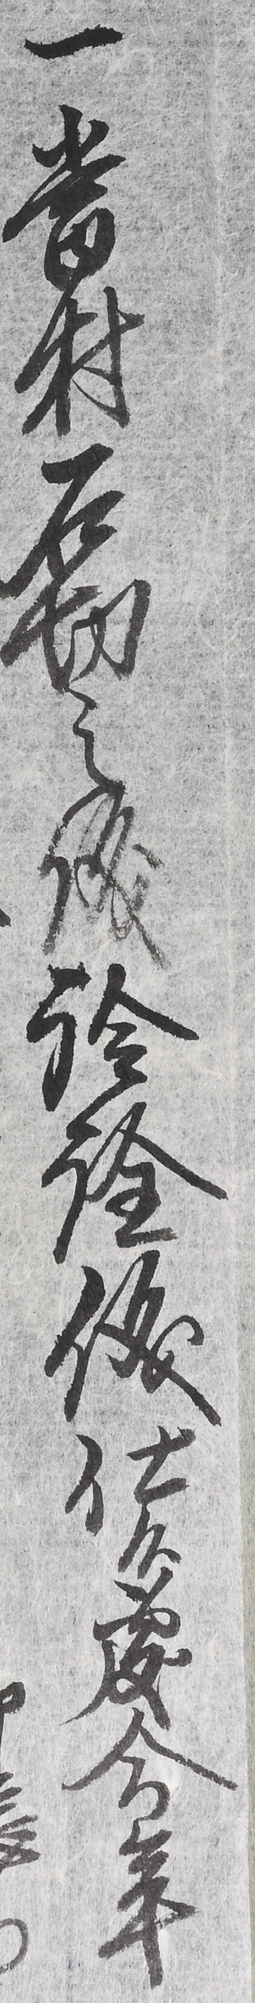一当村石切之儀詮詮儀仕候処今年
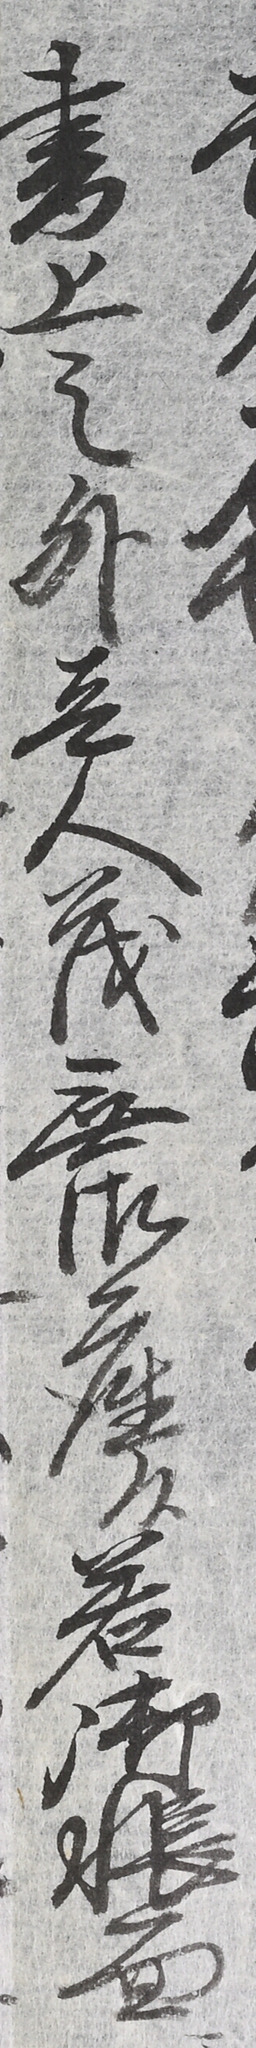書上之外壱人も無御座候若御帳面ニ
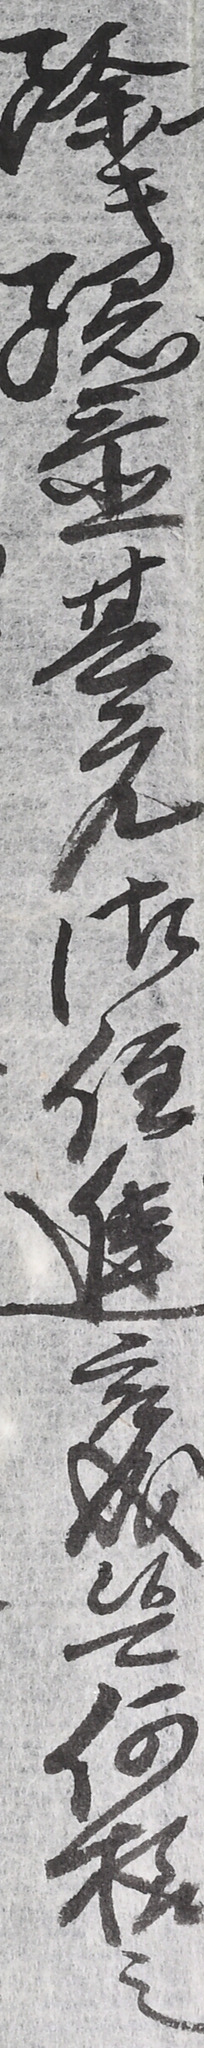除キ隠置其元御注進被成候て何様之
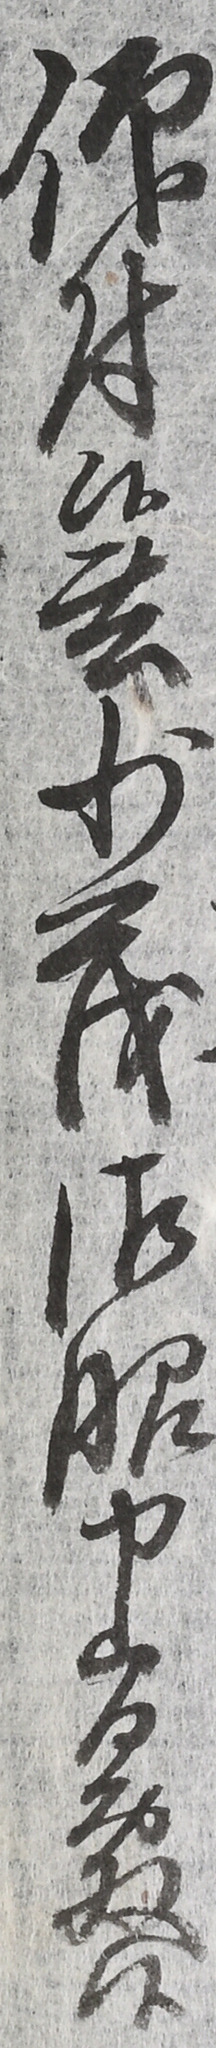御咎被仰付候共少も御恨申間敷候
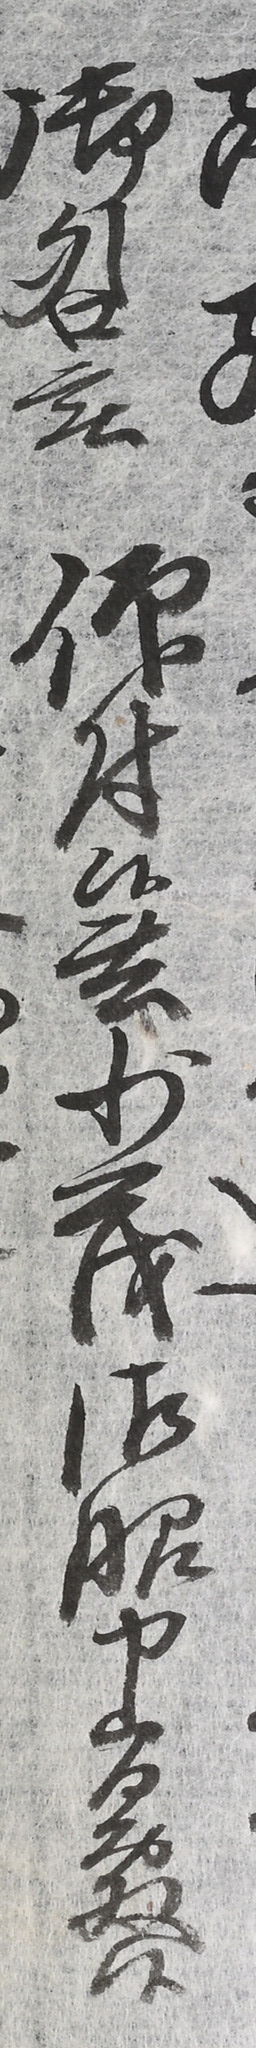御咎被仰付候共少も御恨申間敷候
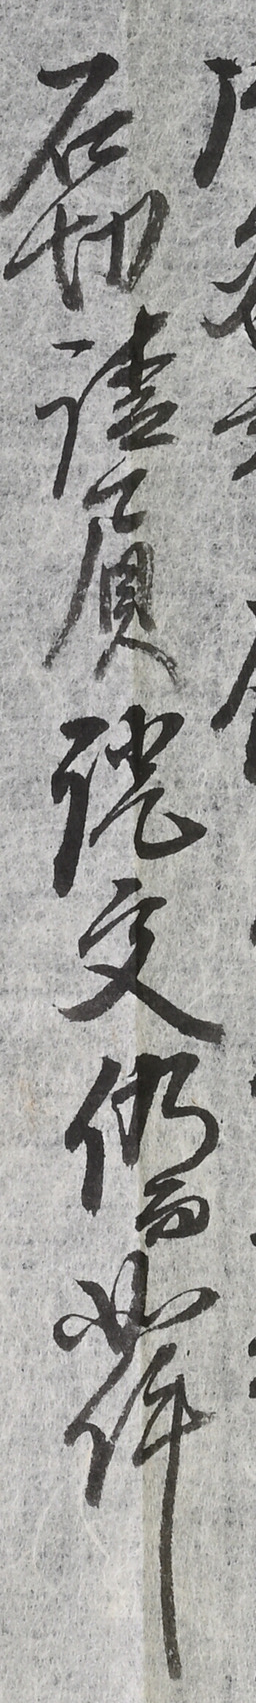石切請負証文仍而如件
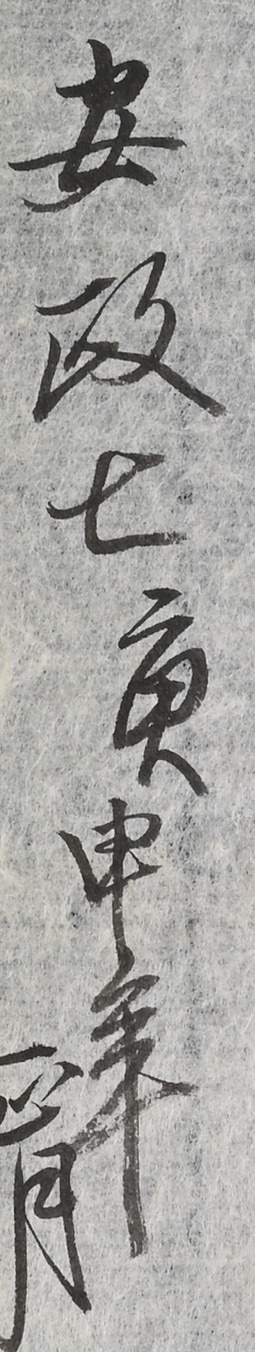安政七庚申年
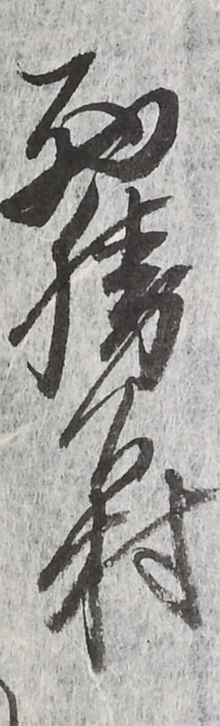西勝間村
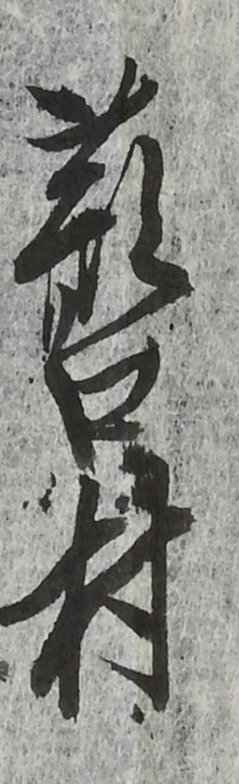荊口村
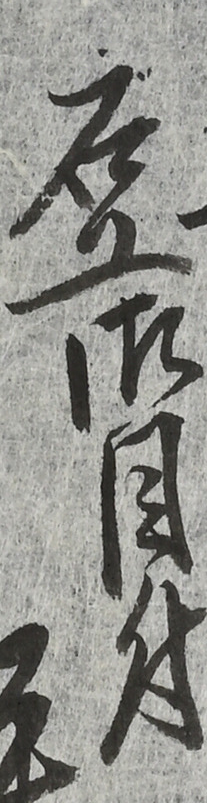石工御目付
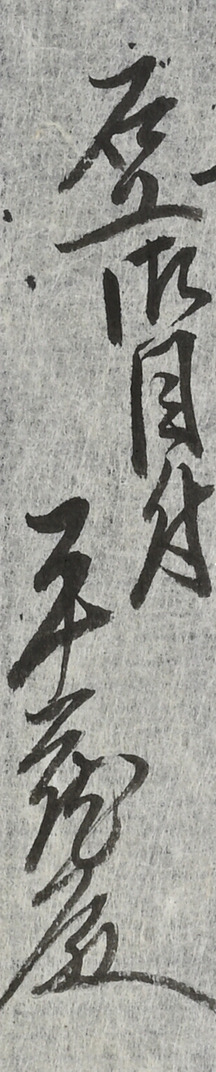平蔵殿
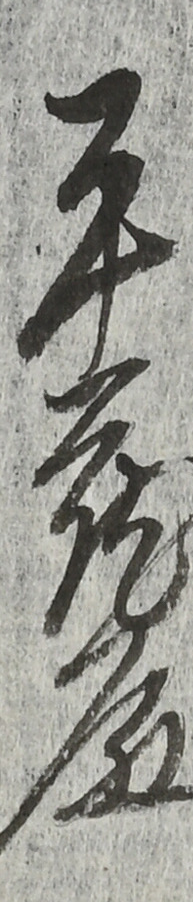平蔵殿
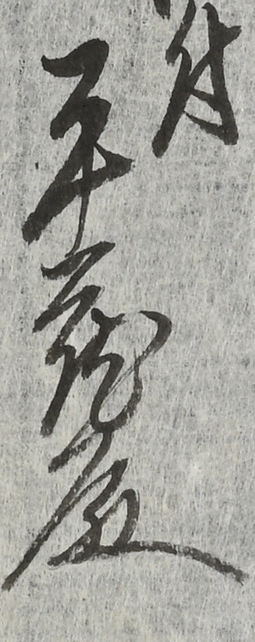平蔵殿
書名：差出申一札之事
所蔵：伊那市立高遠町図書館・合同会社AMANE
